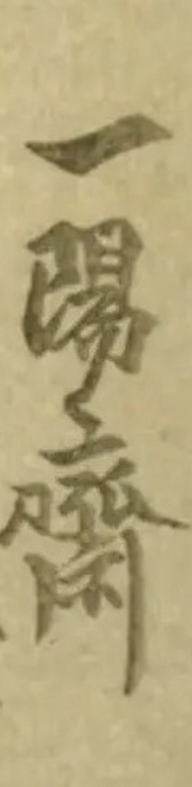一陽斎
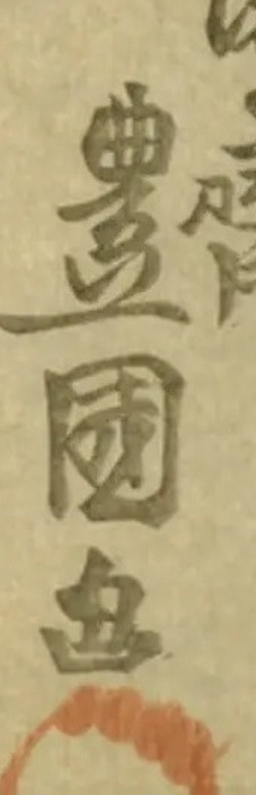豊国画
